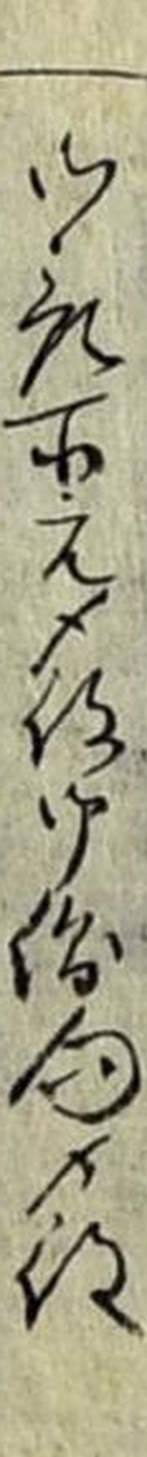御預所元〆役御側向〆役
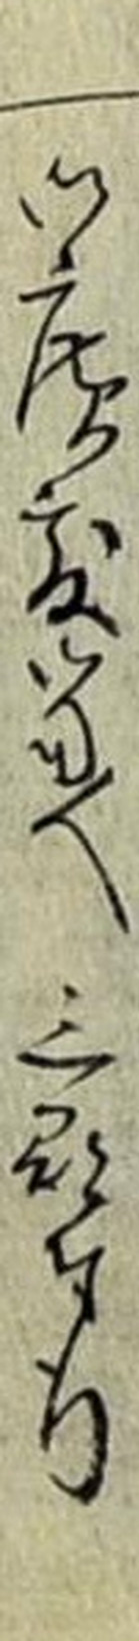御広敷御用人三郡奉行
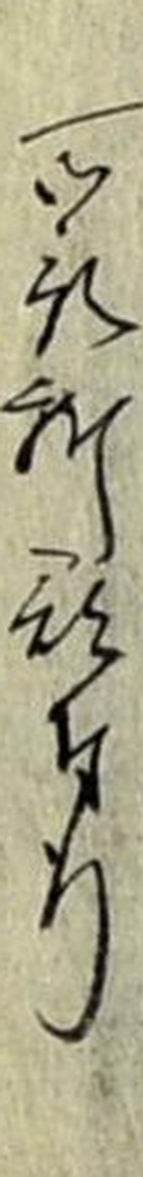御預所郡奉行
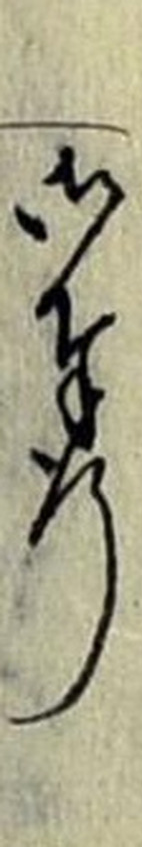御奉行
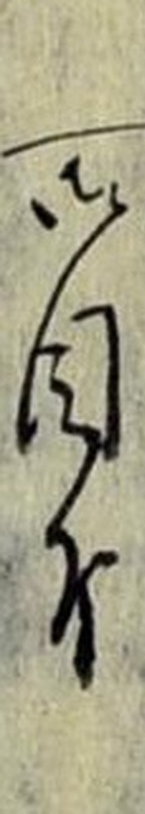御目付
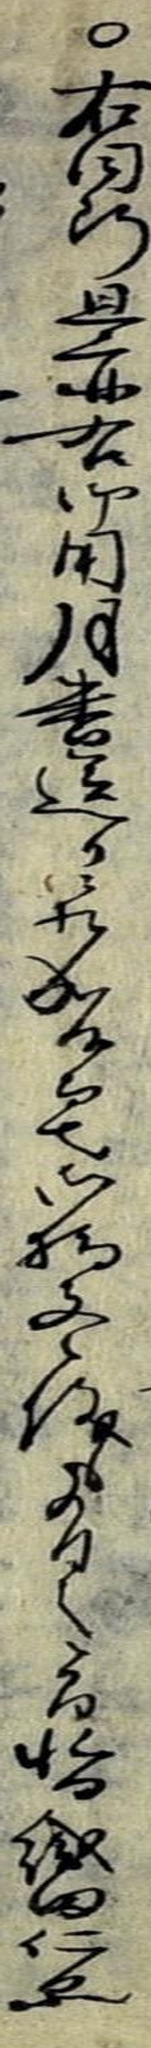〇右同断且亦右御用月番送りニ相成候而者御指支候儀も有之候間暫織田仁兵衛
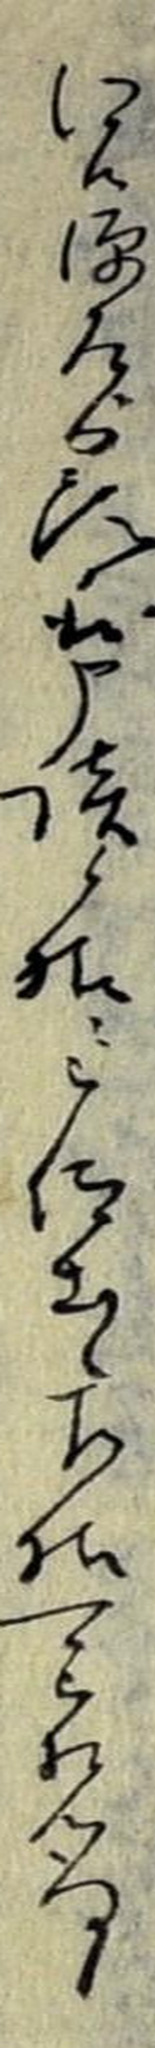江口源左衛門頭取申談候様ニ被仰出候左様可被相心得候
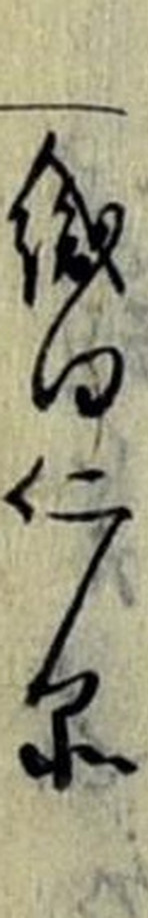織田仁兵衛
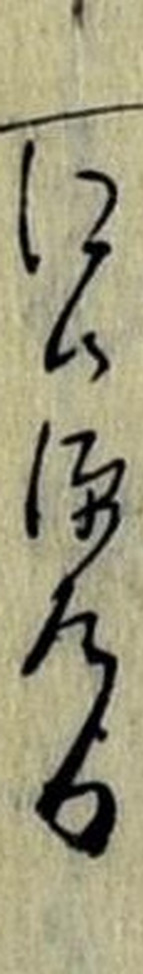江口源左衛門
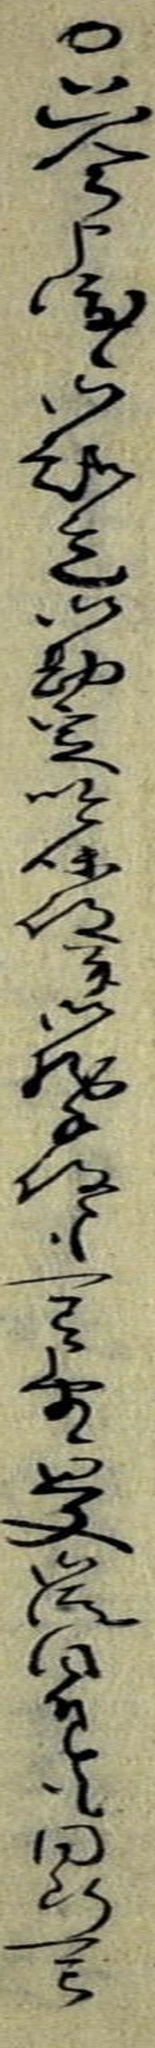〇只今申渡候御趣意御勘定吟味役并御勝手役へも可被申聞候且又御徒目付とも同断可被
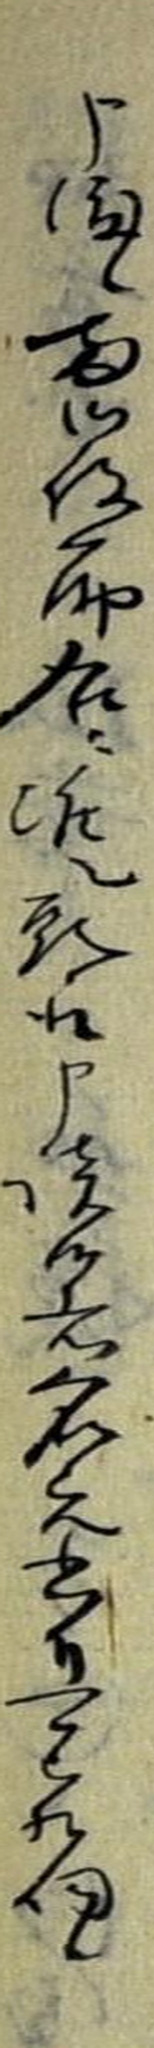申渡候両御役筋右ニ准シ頭取申談候者名元書付可被相伺候
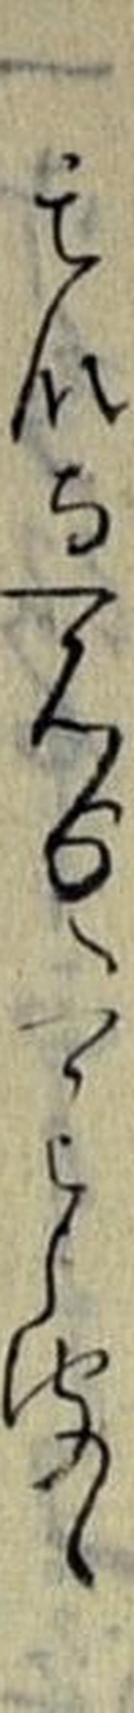其段与一右衛門へ可被申聞候
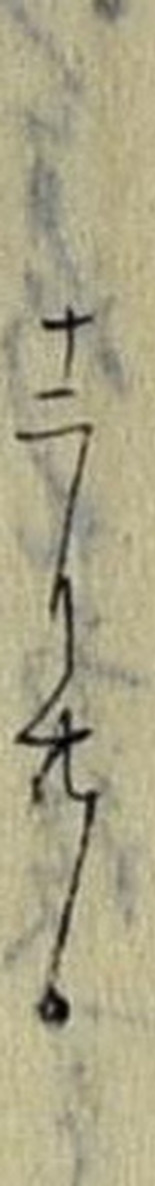十二月廿日
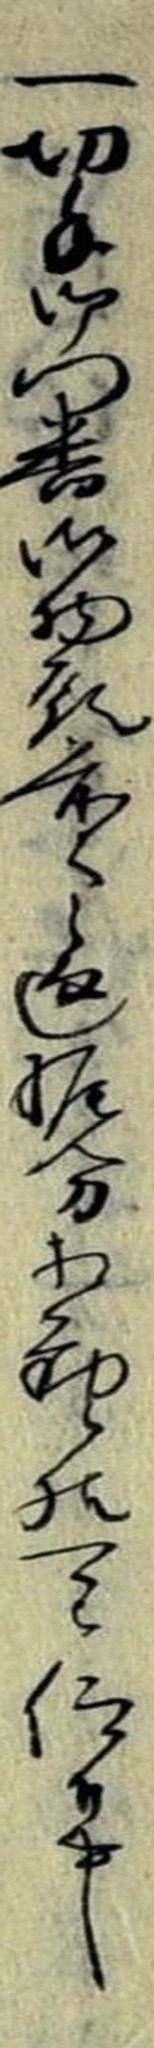一切手御門番御物頭前々之通振分相勤候様可被仰付事
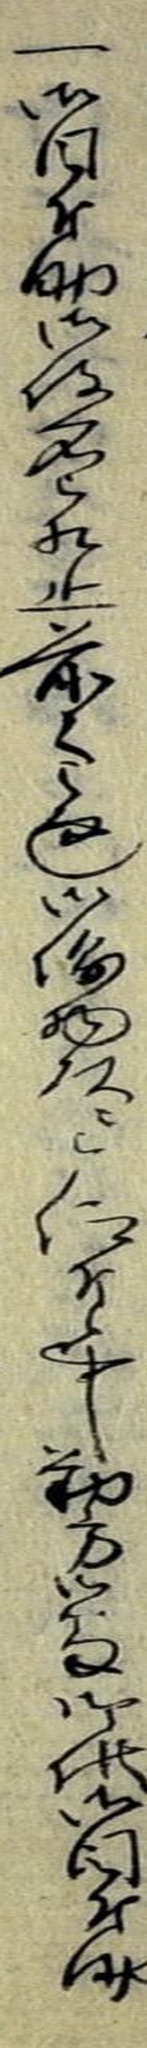一御目付助御役名被相止前々之通御側物頭ニ被仰付候事勤方御番御供御目付助
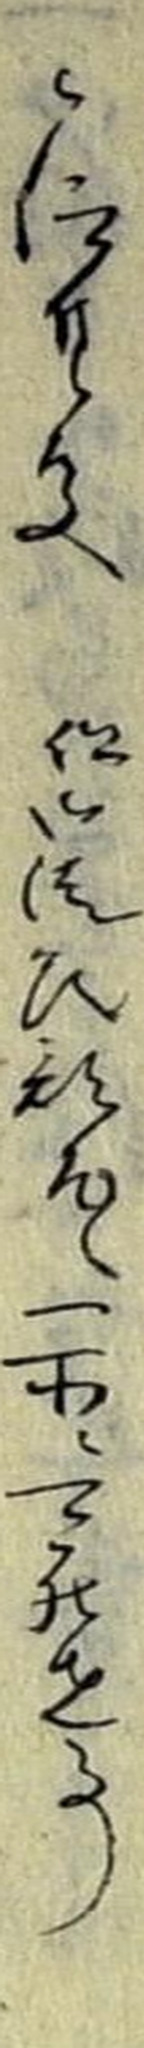被仰付候事但御徒頭部屋へ一所ニ可罷在事
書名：命令之部 三
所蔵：福井県文書館 Fukui Prefectural Archives
